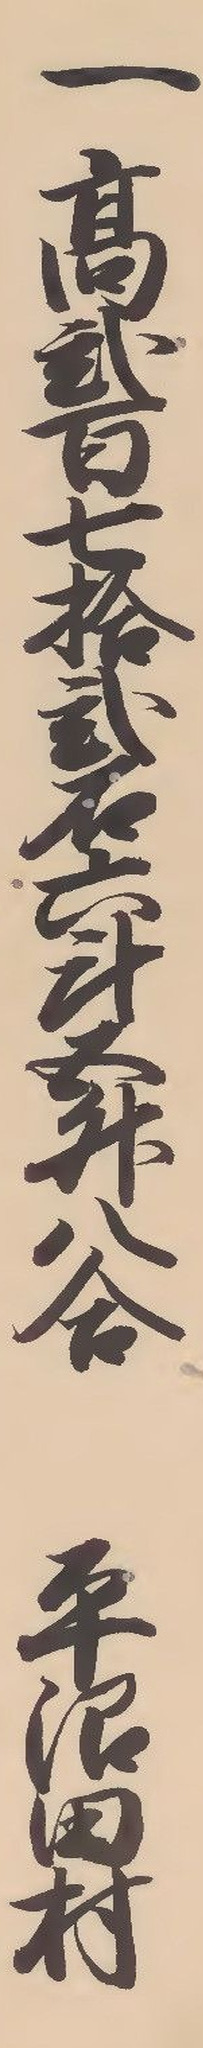一高弐百七拾弐石六斗五升八合平沼田村
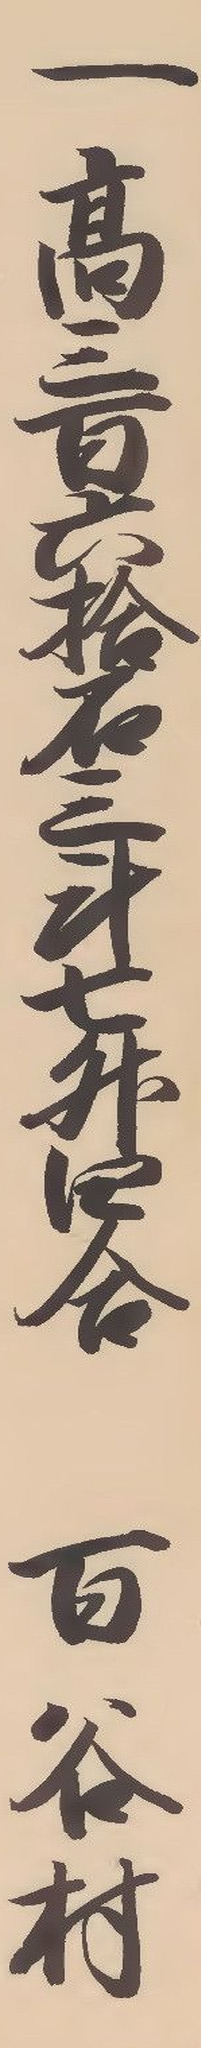一高三百六拾石三斗七升四合百谷村
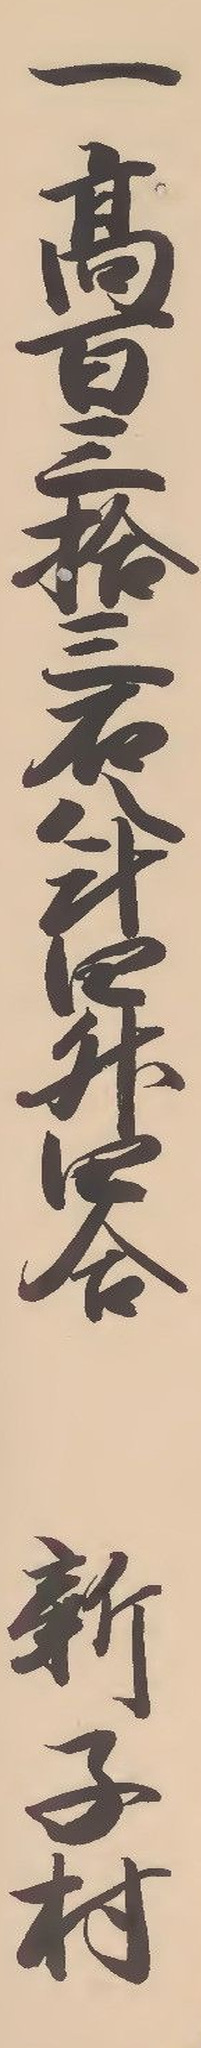一高百三拾三石八斗四升四合新子村
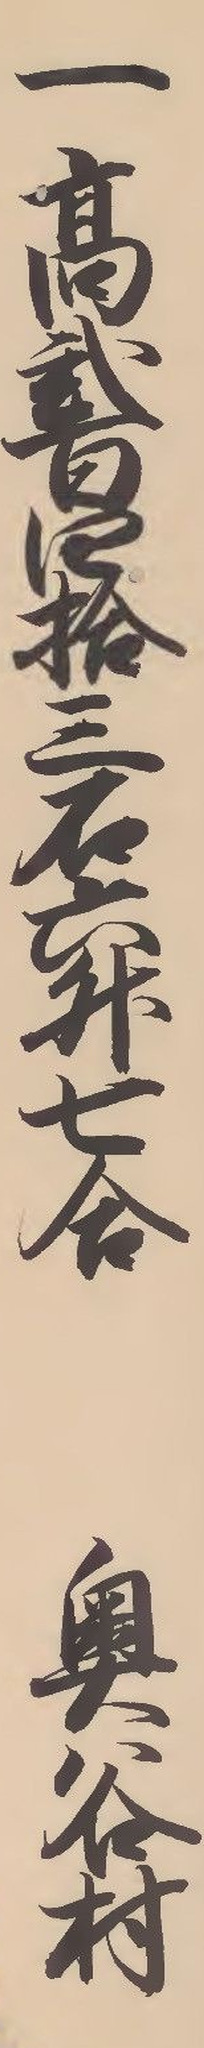一高弐百四拾三石六升七合奥谷村
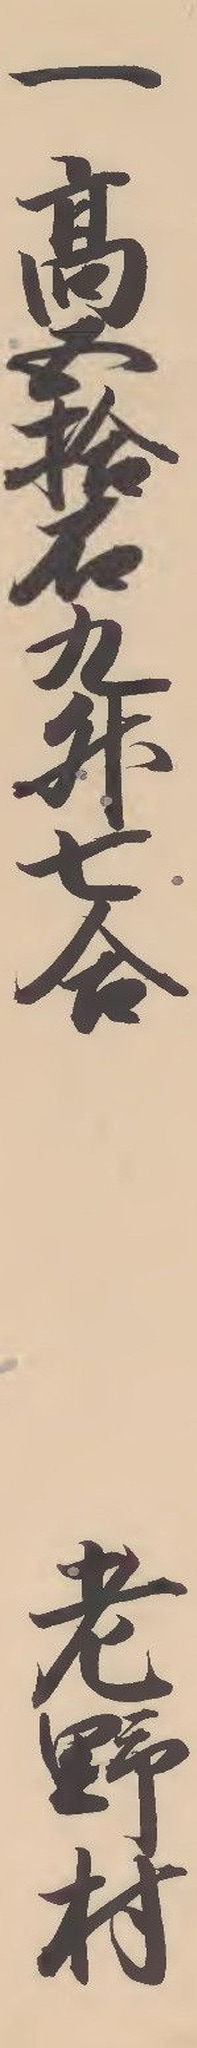一高五拾石九升七合老野村

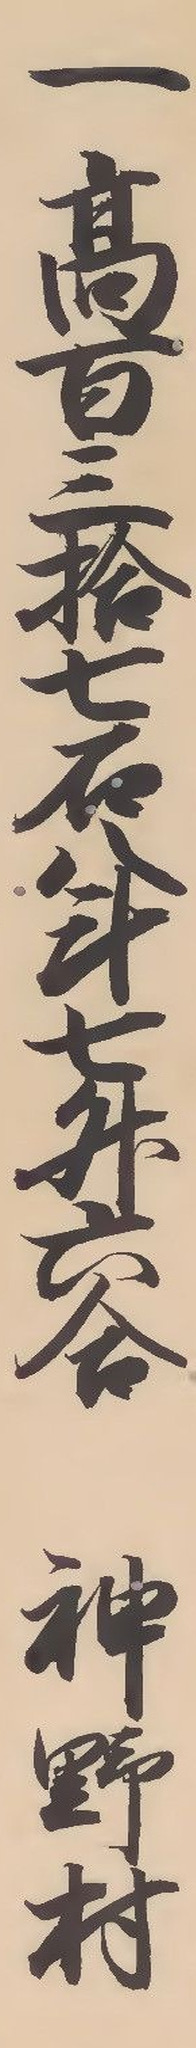一高百三拾七石八斗七升六合神野村
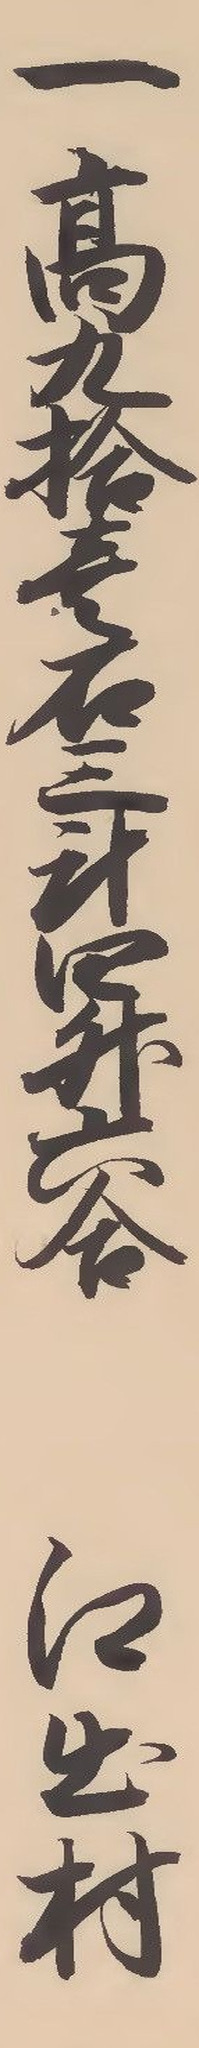一高九拾壱石三斗四升六合江出村
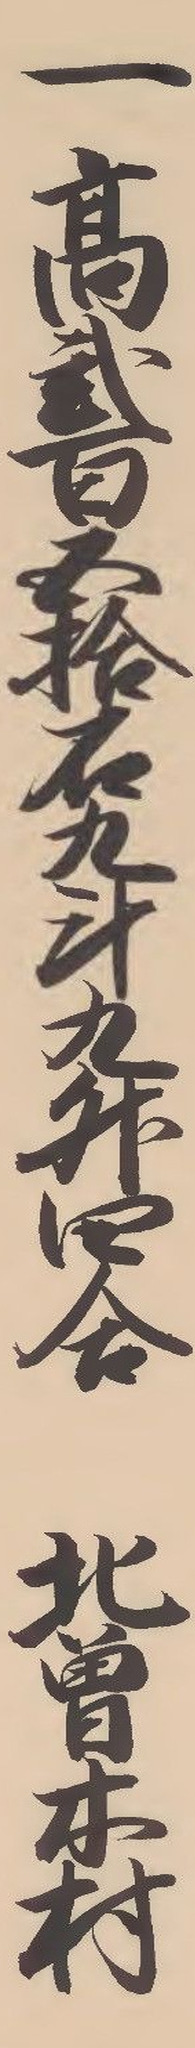一高弐百五拾石九斗九升四合北曽木村
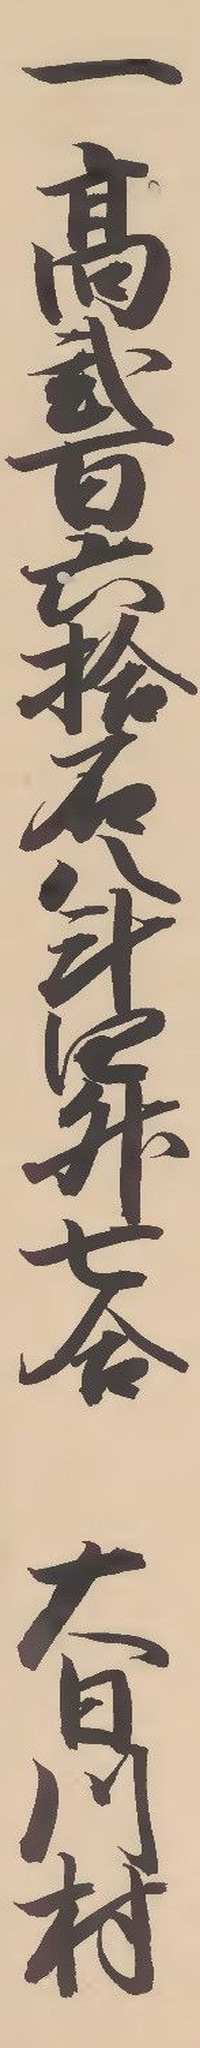一高弐百六拾石八斗四升七合大日川村
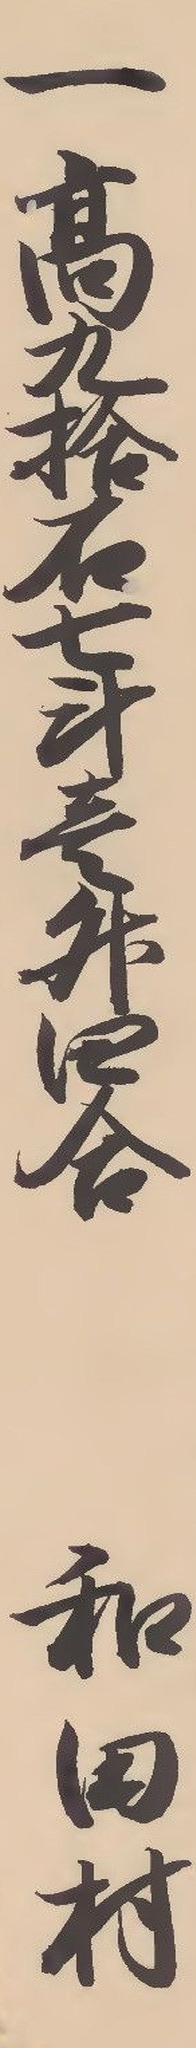一高九拾石七斗壱升四合和田村
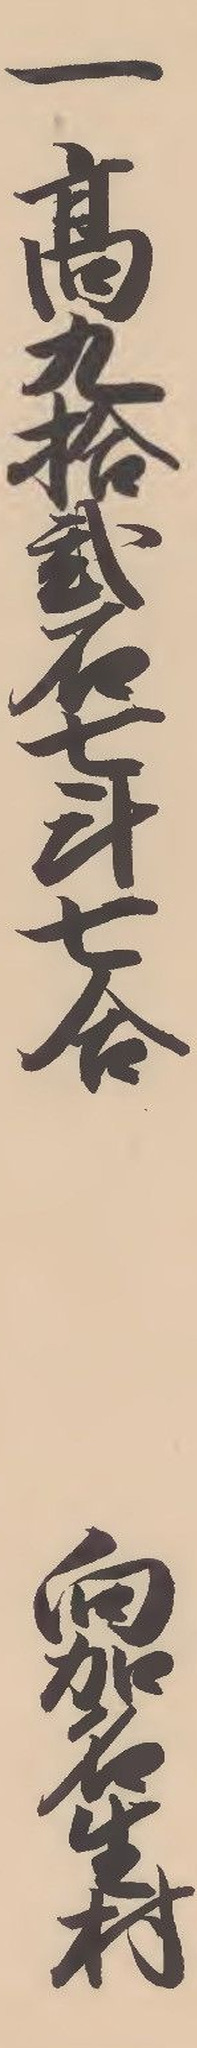一高九拾弐石七斗七合向加名生村
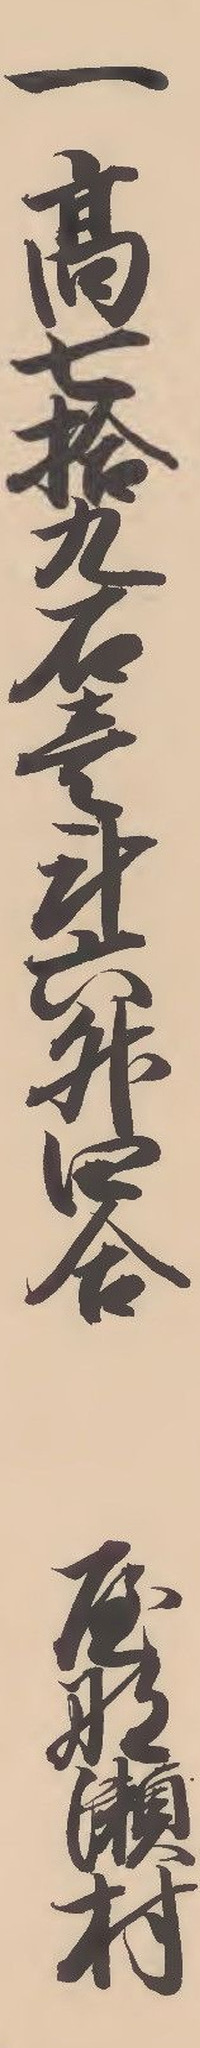一高七拾九石壱斗六升四合屋那瀬村
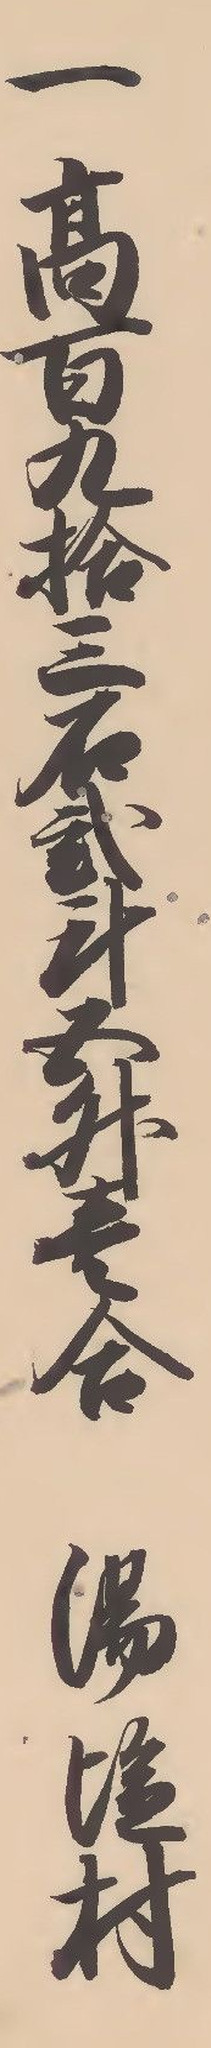一高百九拾三石弐斗五升壱合湯塩村

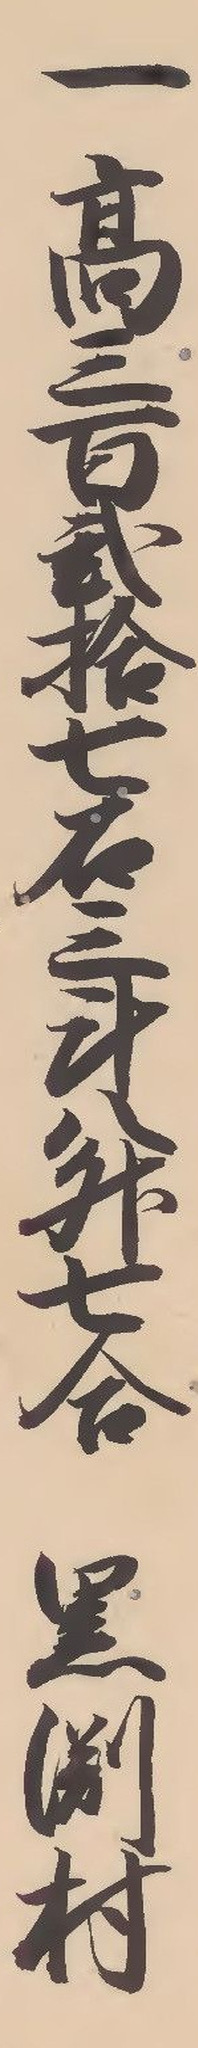一高三百弐拾七石三斗八升七合黒渕村
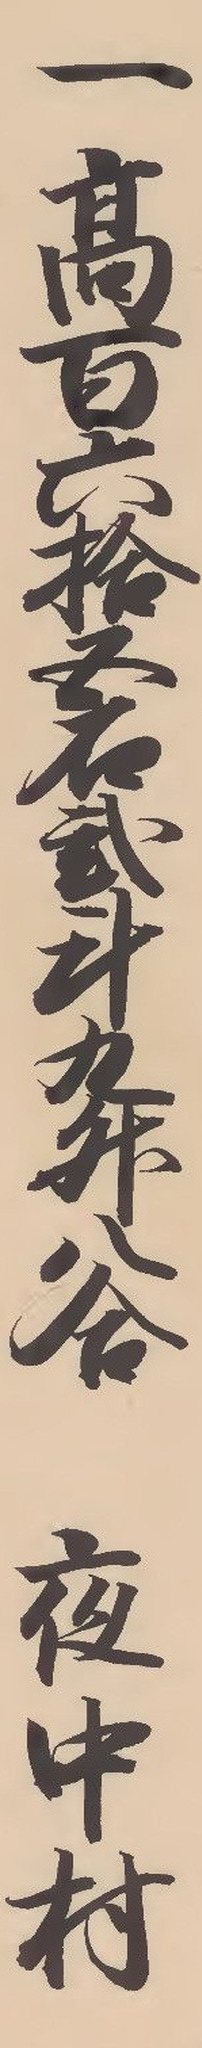一高百六拾五右弐斗九升八合夜中村
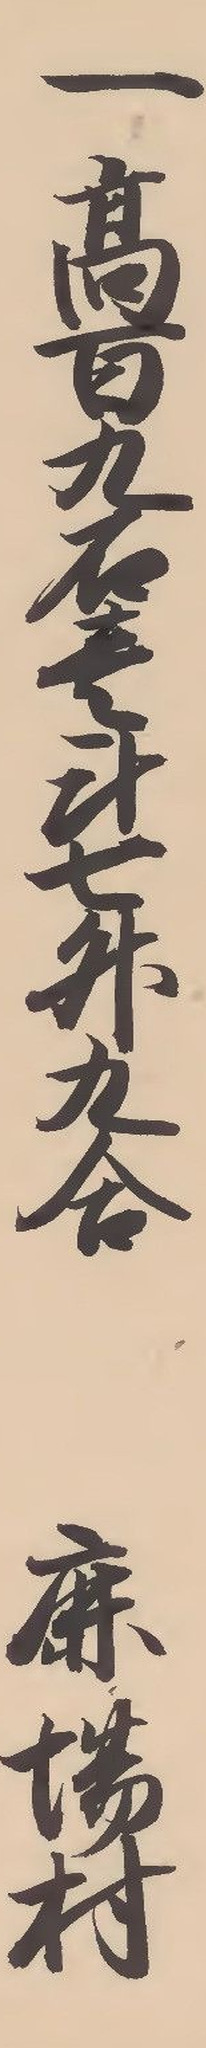一高百九石壱斗七升九合鹿場村
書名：大和国郷帳
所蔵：国立公文書館 National Archives of Japan
